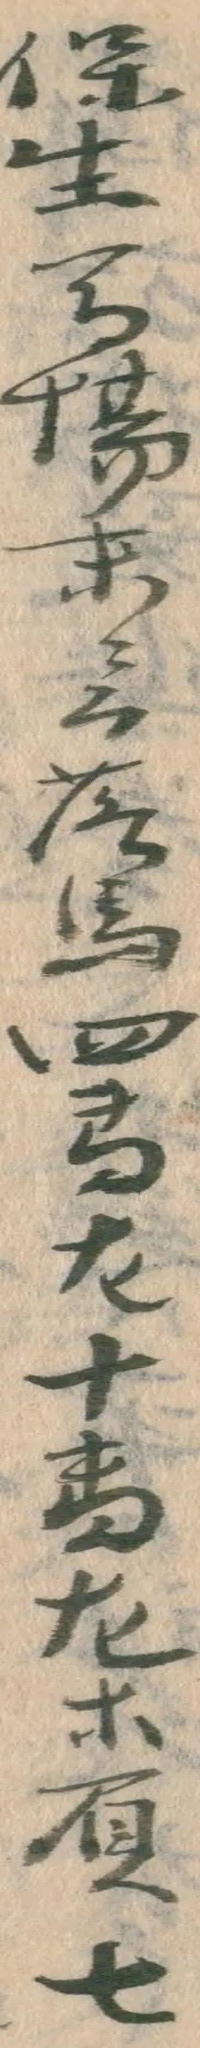保生馬場末ニ而落馬、四番左・十番左等負、七
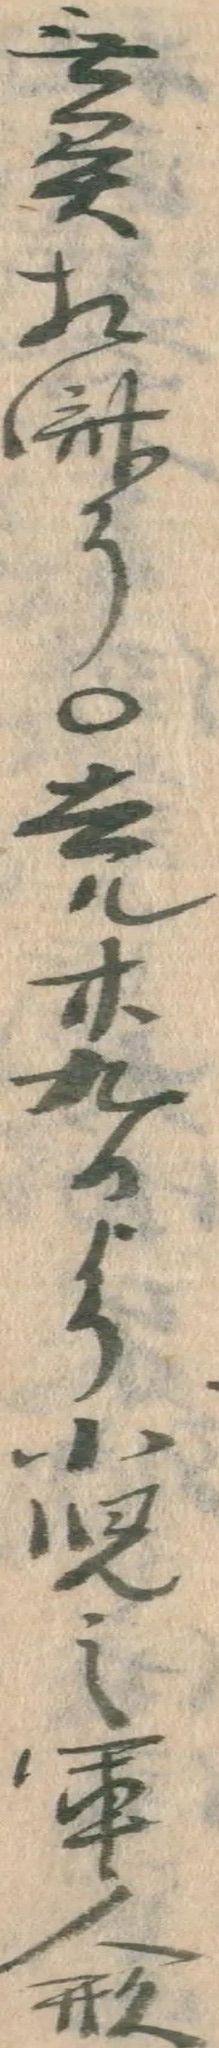無異相済事、○去ル廿九日より小児之軍人形
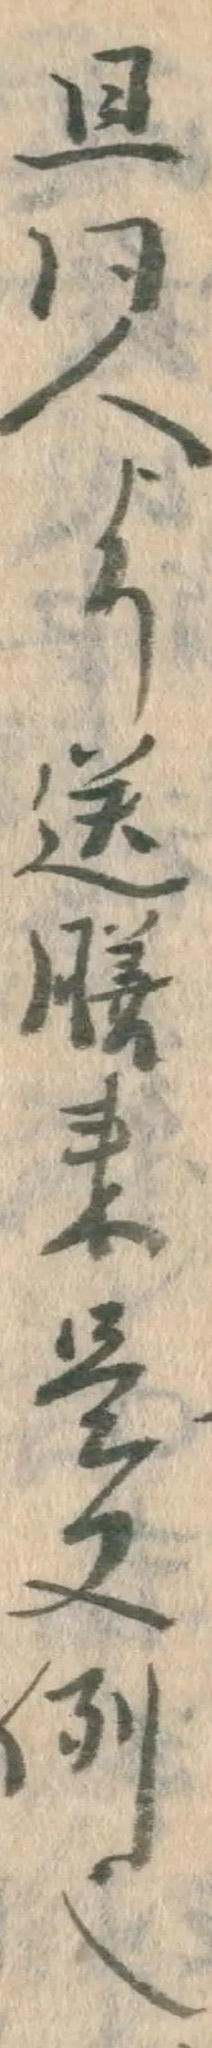且同人より送膳来、是又例也、
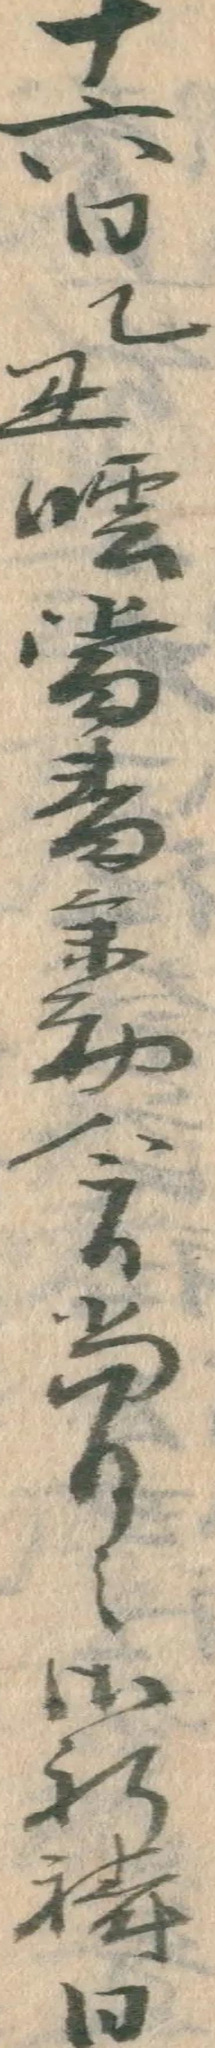十六日乙丑晴、當番参勤、今日當月之御祈祷日
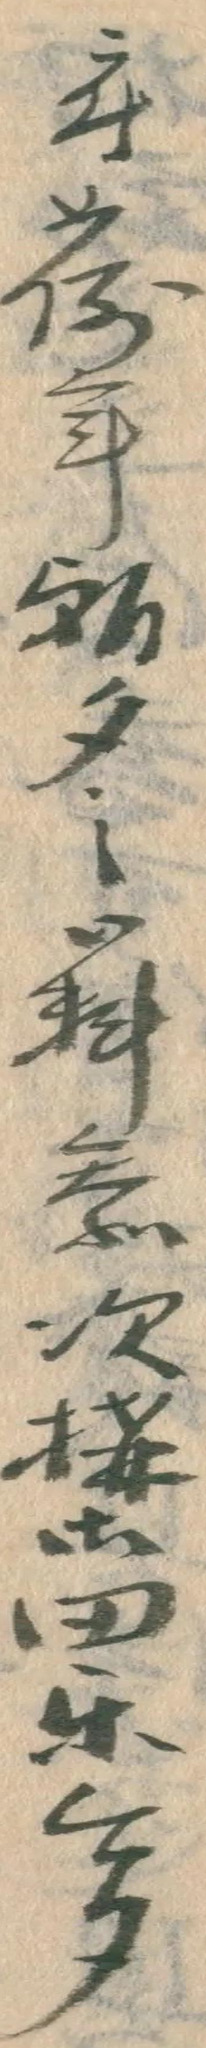ニ付、如例年朝夕之御料参、次構御田楽、今夕
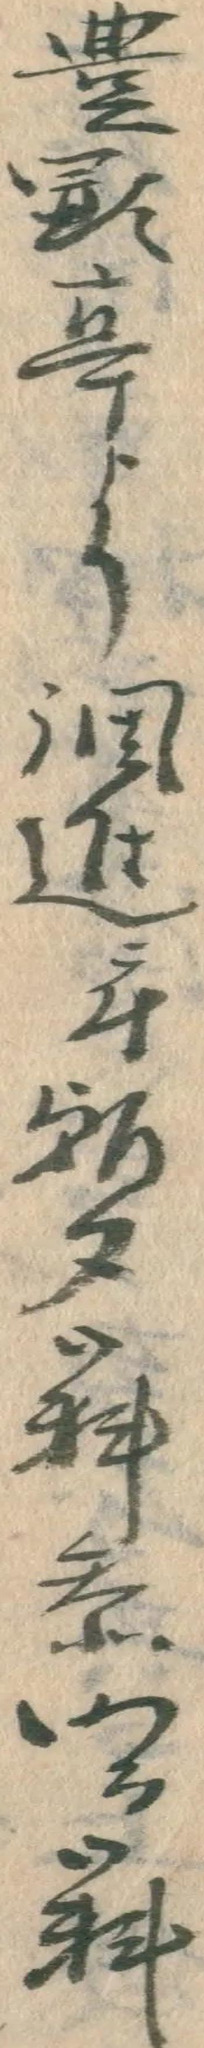豊顕亭より調進ニ付、朝夕御科参、仍而御料
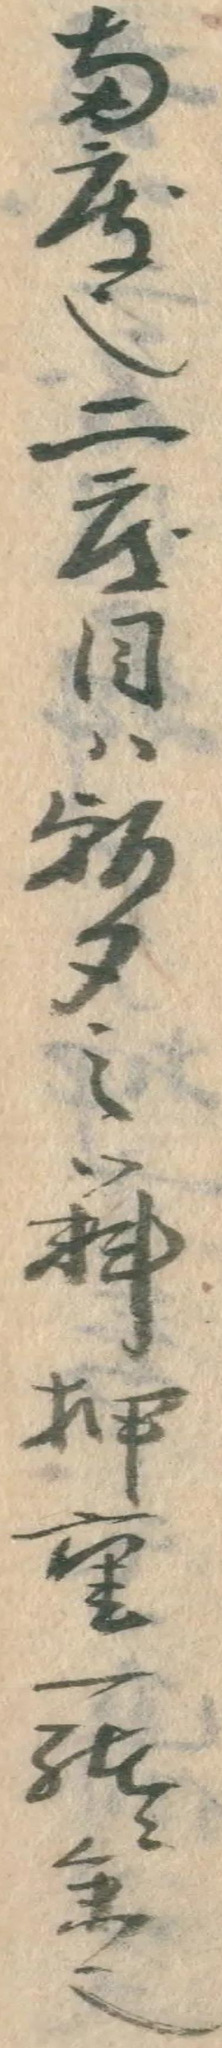両度也、二度目ハ朝夕之御料、押重一躰ニ参也、

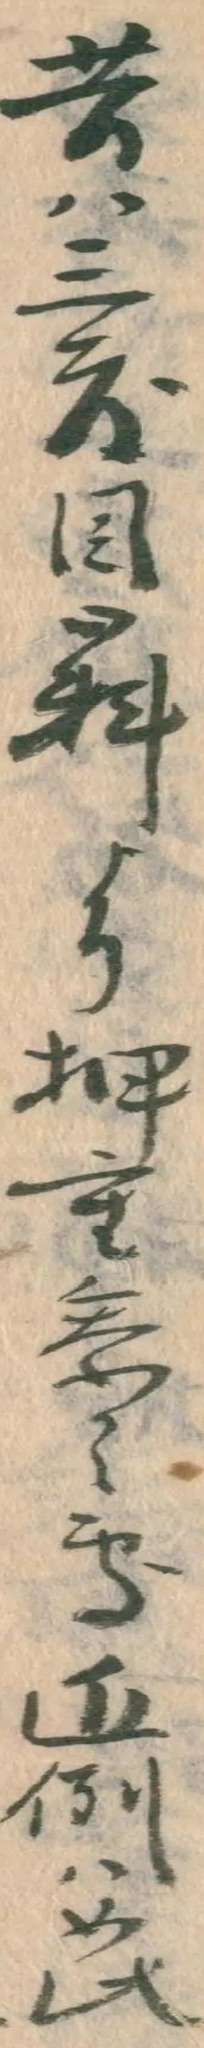昔は三度目御料より押重参之處、近例ハ如此
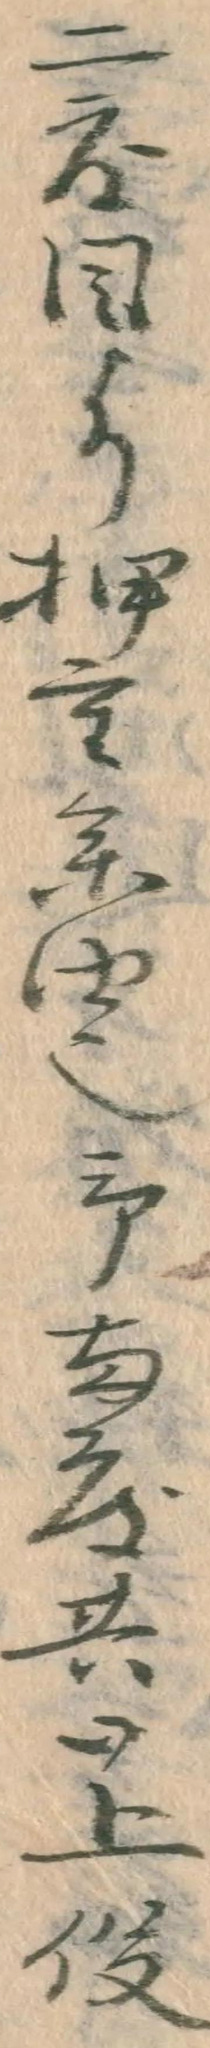二度目より押重参由也、予両度共御上役
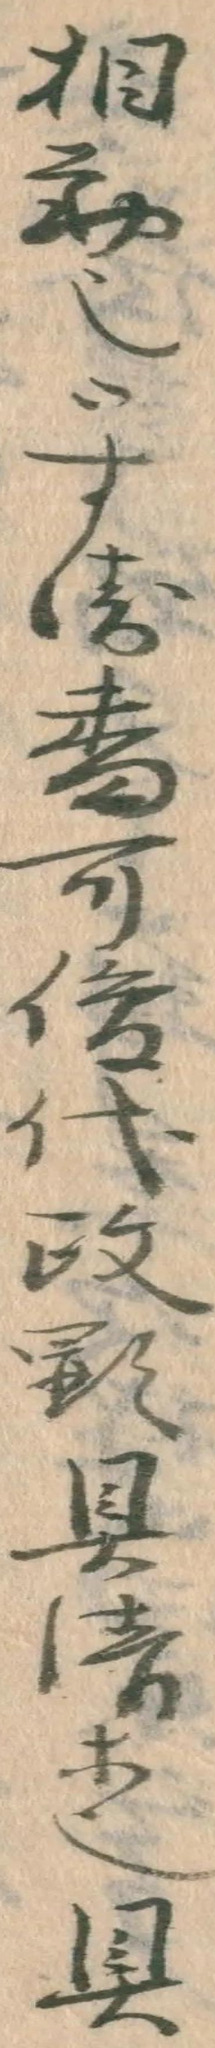相勤也、御すゑ番可俊代政顕・具清等也、具
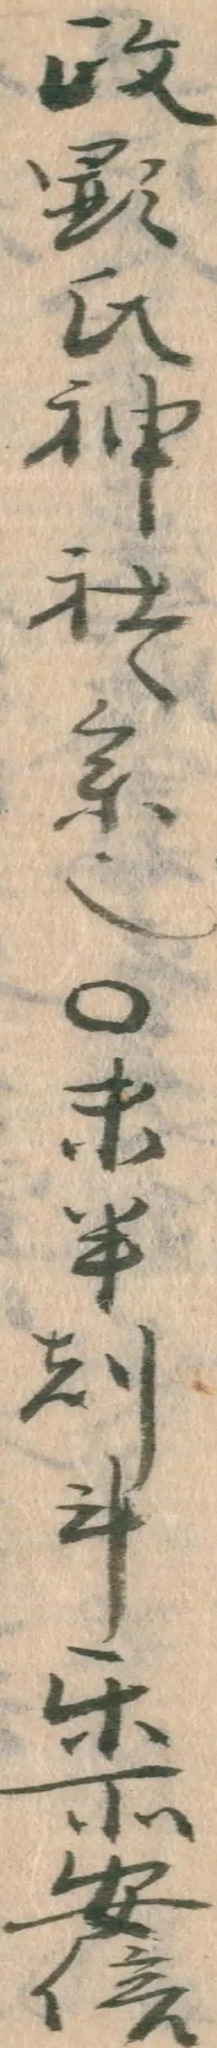政顕氏神社へ参也、〇未半刻斗楽所安倍
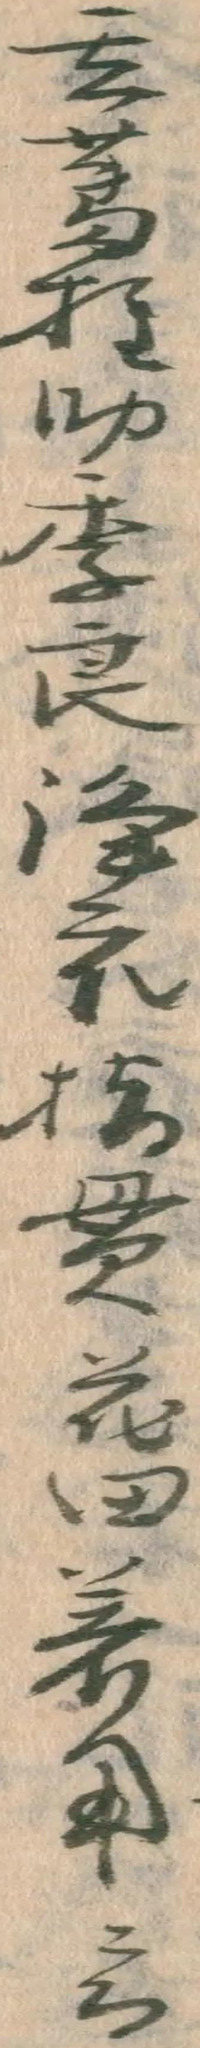玄蕃椎助季良浄衣指貫花田着用ニ而
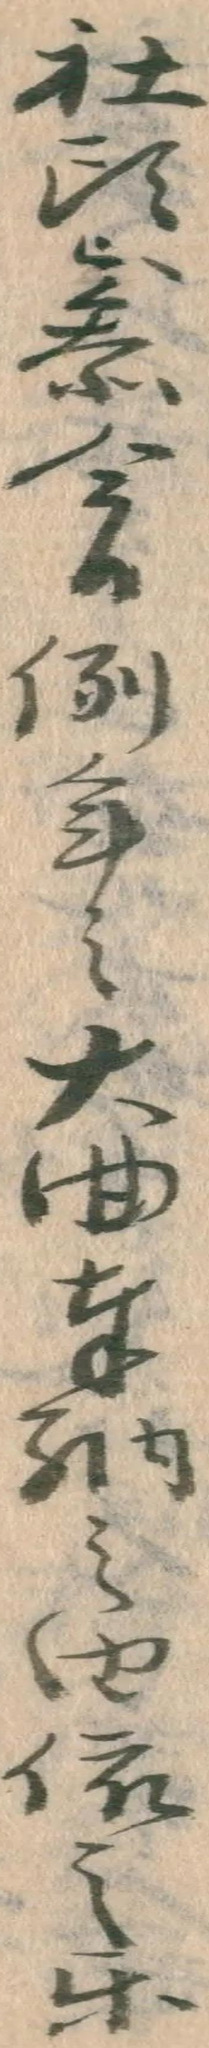社頭へ参、今日例年之大曲奉納之由、依之楽
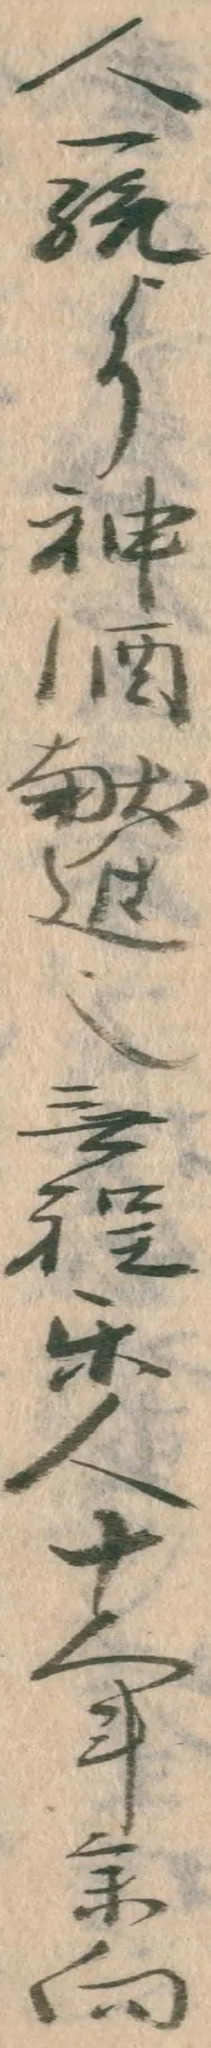人一統より神酒献進也、無程楽人十人計参向、
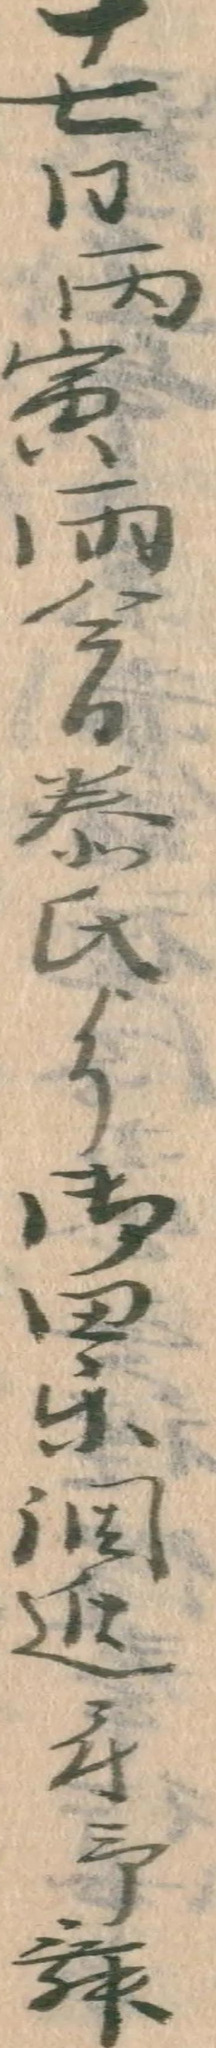十七日丙寅雨、今日泰氏より御田楽調進ニ付、予舞
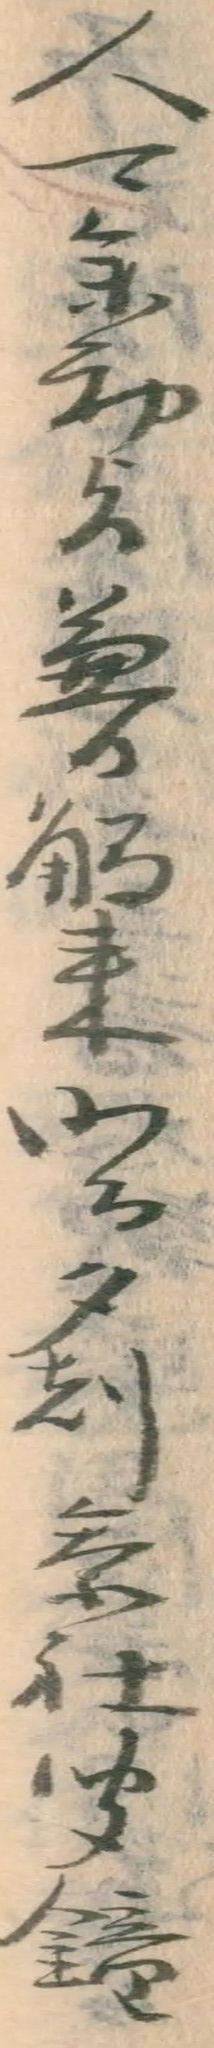人可参勤旨、兼日触来、仍而夕刻参社、聞鐘
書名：賀茂社記録. 第63冊
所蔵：国立国会図書館 National Diet Library, JAPAN
